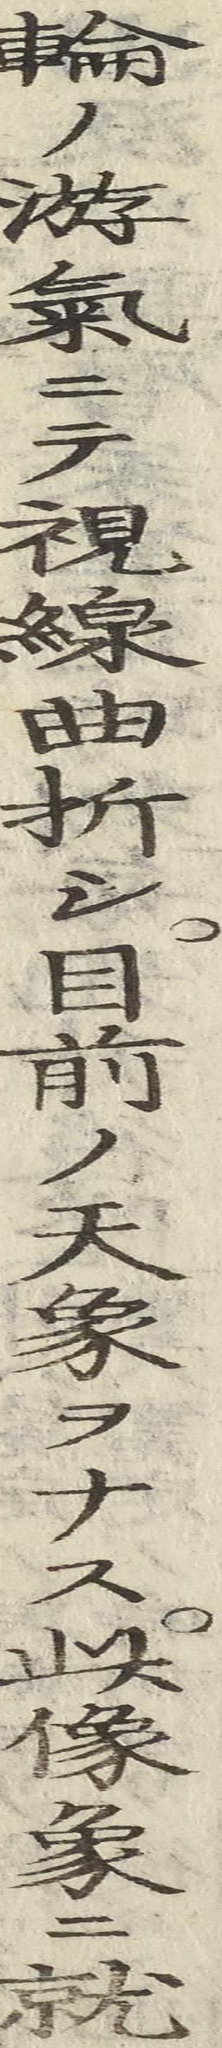輪ノ游気ニテ視線曲折シ。目前ノ天象ヲナス。此像象ニ就
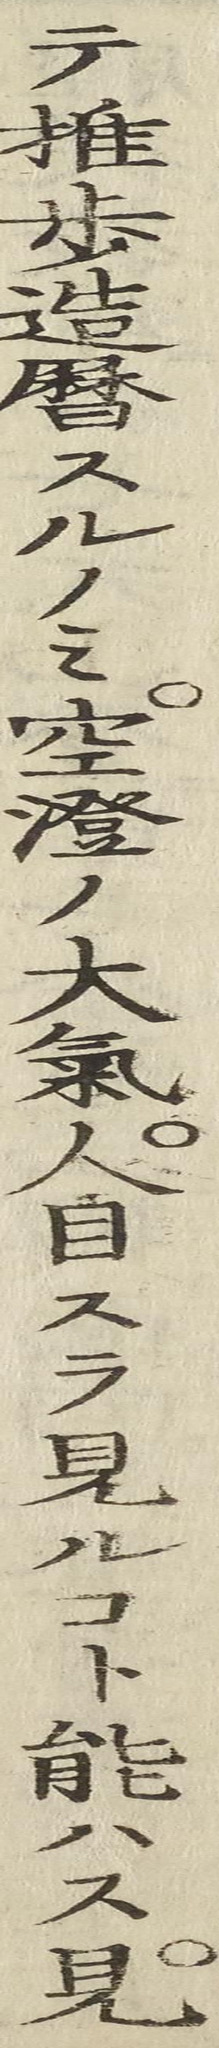テ推歩造暦スルノミ。空澄ノ大気。人目スラ見ルコト能ハス。見
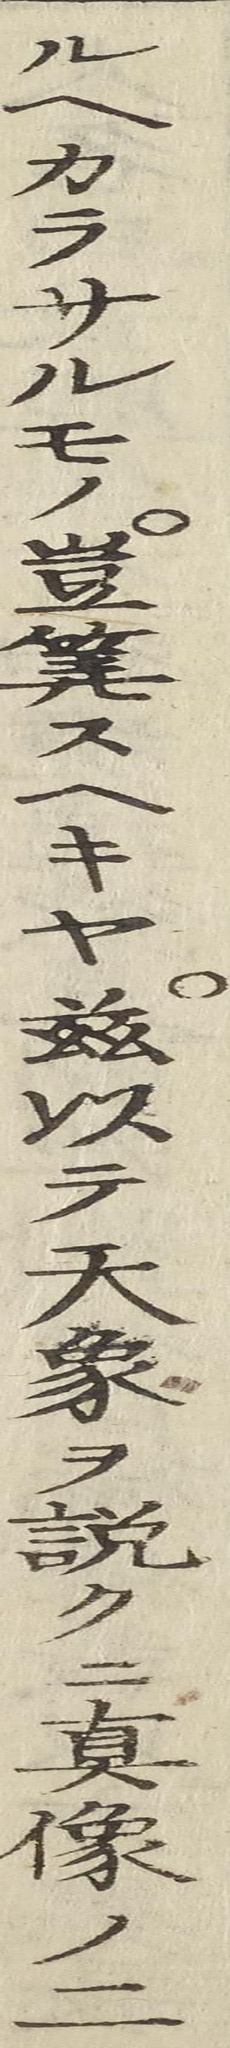ルヘカラサルモノ。豈筭スヘキヤ。茲以テ天象ヲ説クニ真像ノニ
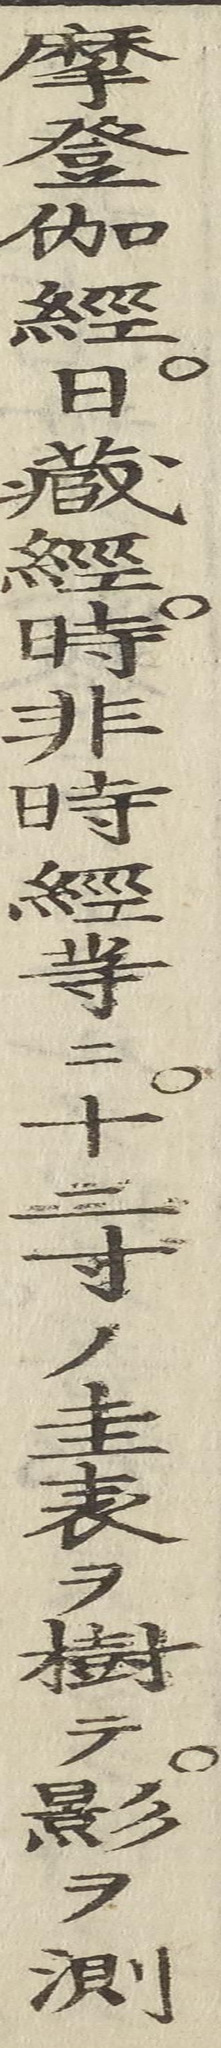摩登伽経。日蔵経。時非時経等ニ。十二寸ノ圭表ヲ樹テ。影ヲ測
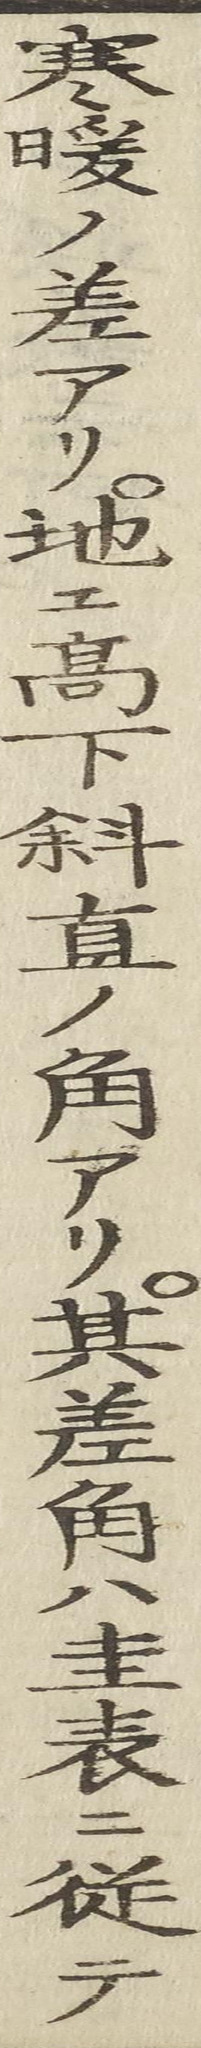寒暖ノ差アリ。地ユ高下斜直ノ角アリ。其差角ハ圭表ニ従テ
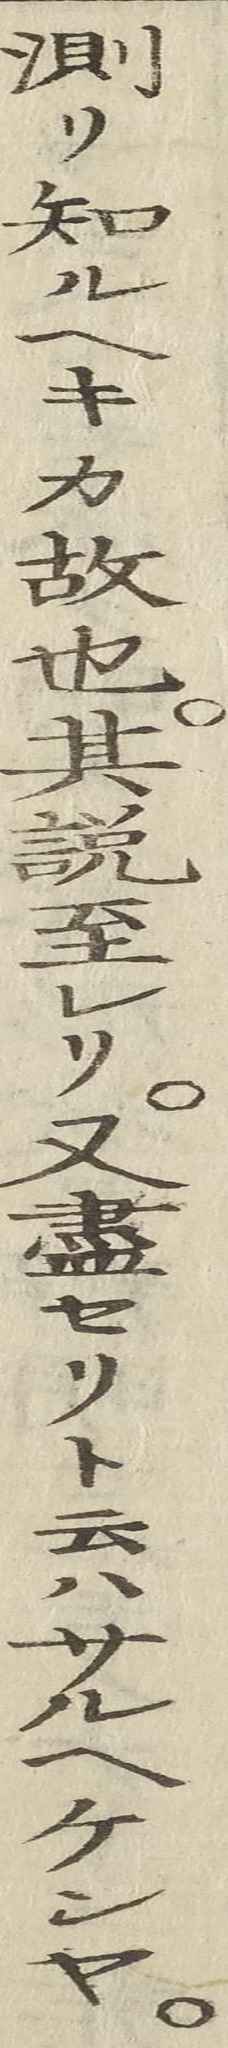測リ知ルヘキカ故也。其説至レリ。又尽セリト云ハサルヘケンヤ。
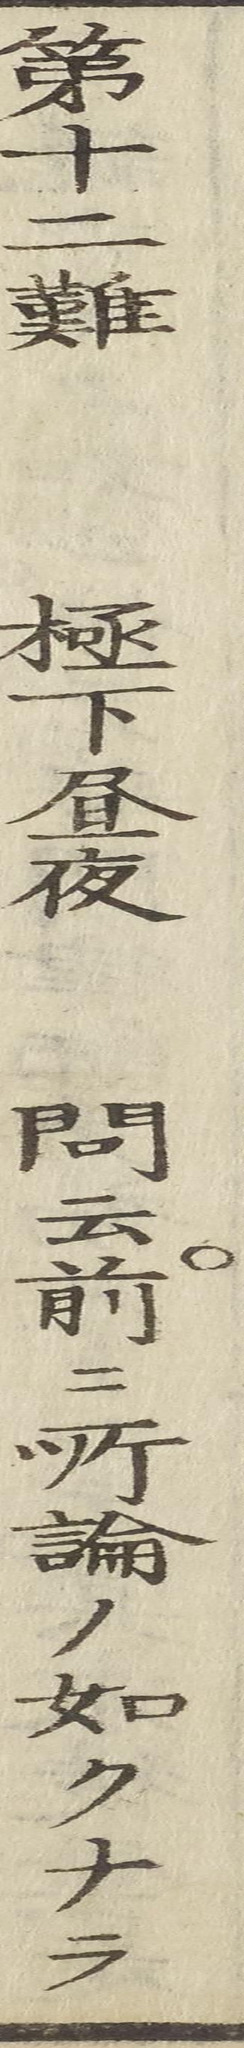第十二難極下昼夜問云。前ニ所論ノ如クナラ
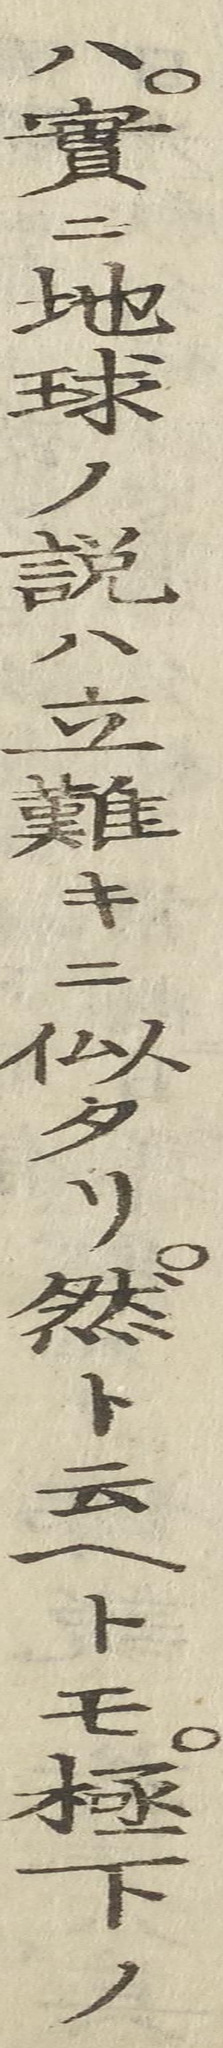ハ。実ニ地球ノ説ハ立難キニ似タリ。然ト云ヘトモ。極下ノ

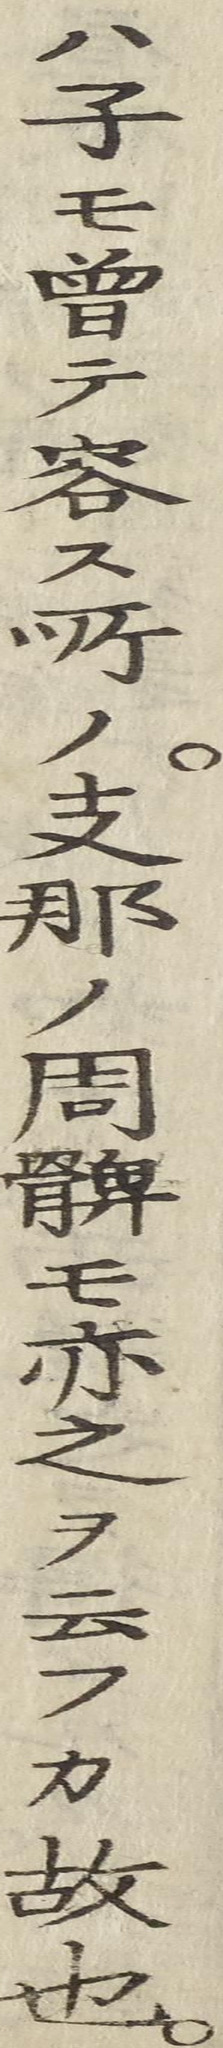ハ子モ曾テ容ス所ノ。支那ノ周体モ亦之ヲ云フカ故也。
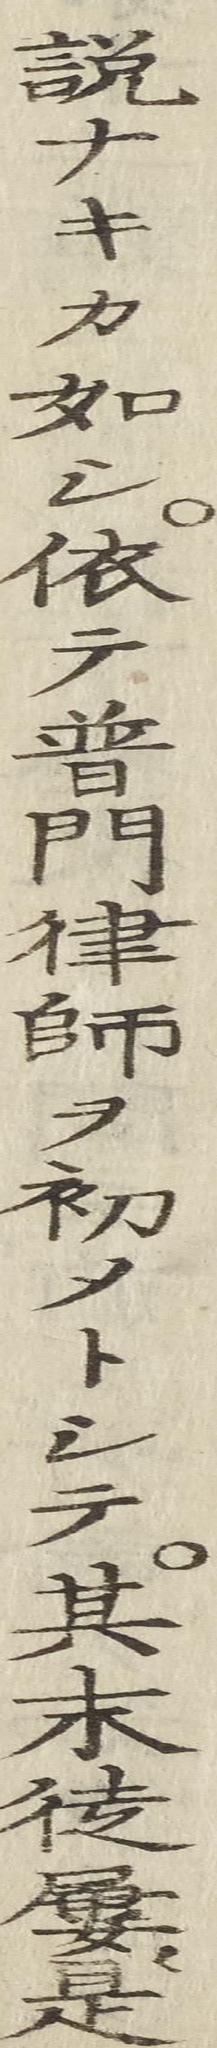説ナキカ如シ。依テ普門律師ヲ初メトシテ。其末徒屢〱是
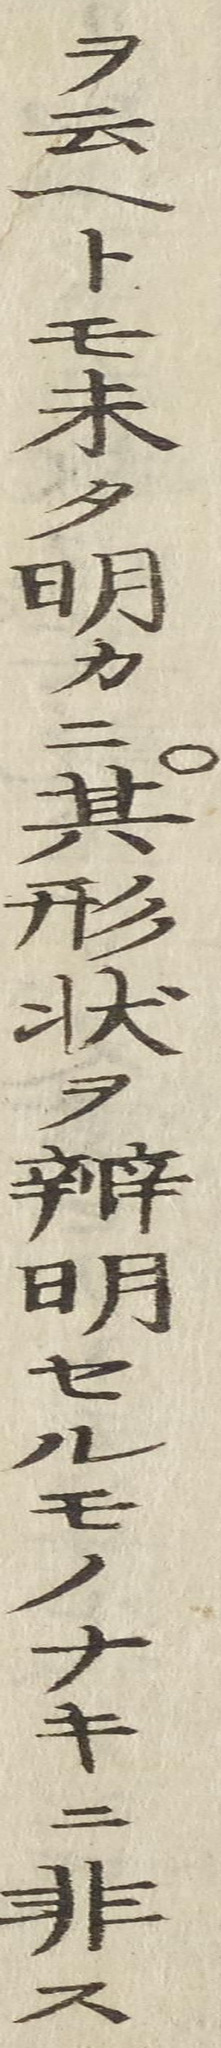ヲ云ヘトモ未タ明カニ。其形状ヲ弁明セルモノナキニ非ス
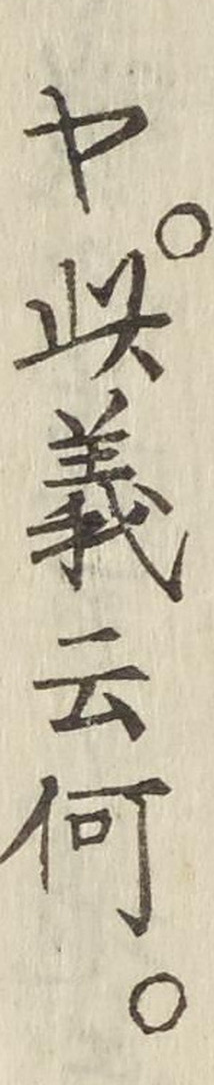ヤ。此義云何。
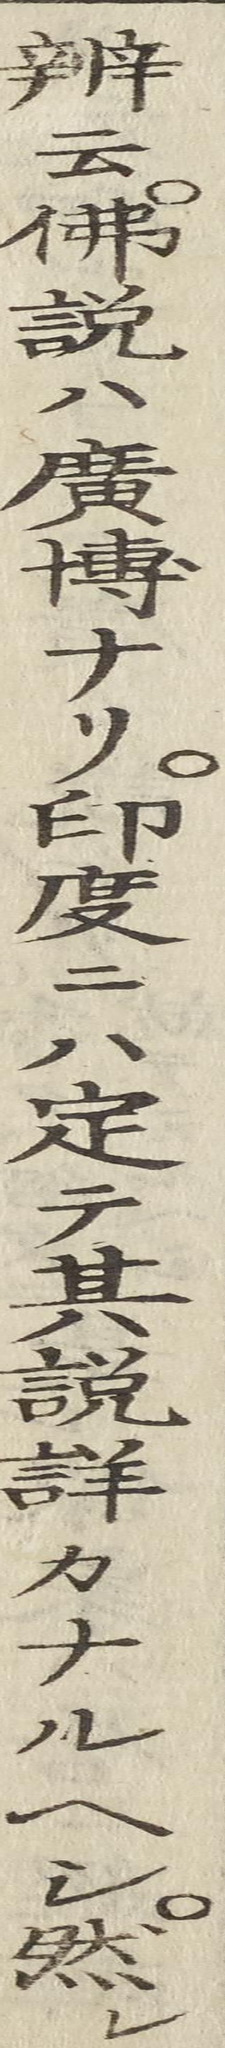弁云。仏説ハ広博ナリ。印度ニハ定テ其説詳カナルヘシ。然レ
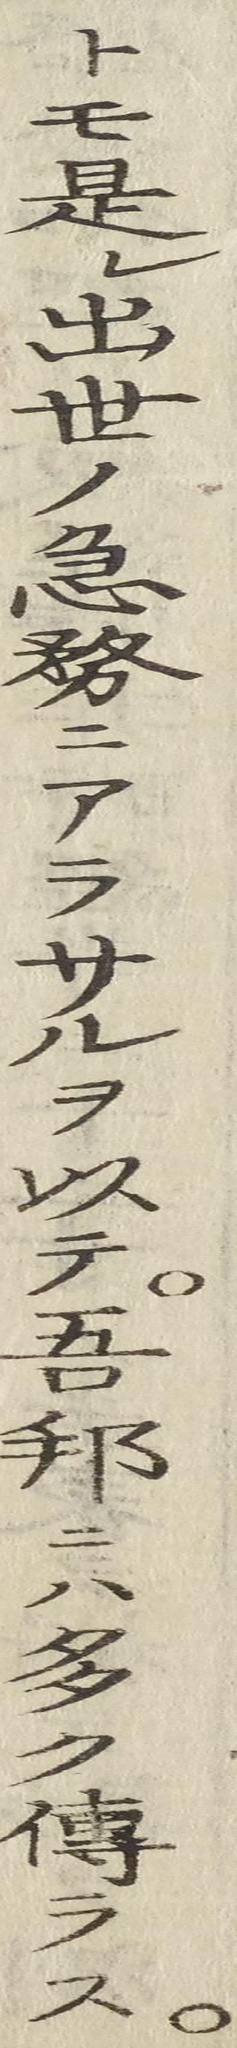トモ是レ出世ノ急務ニアラサルヲ以テ。吾邦ニハ多ク伝ラス。
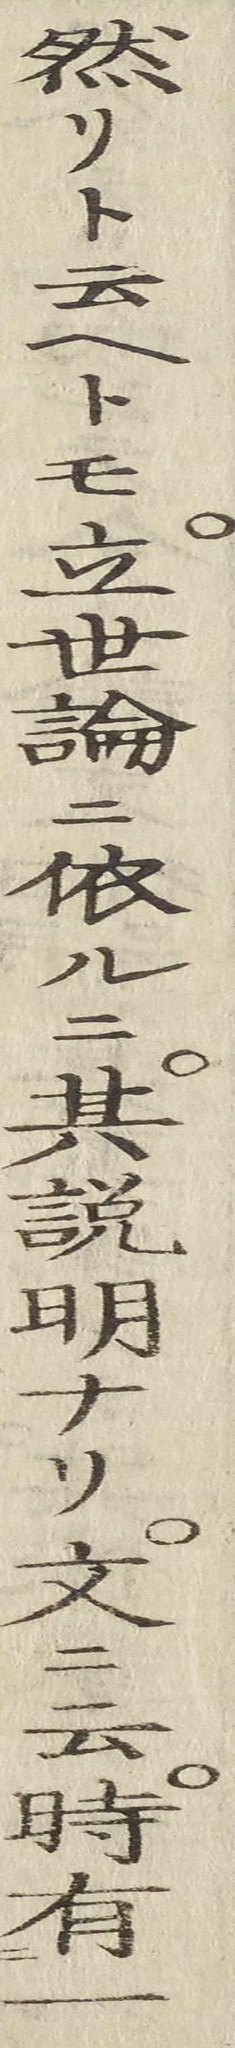然リト云ヘトモ。立世論ニ依ルニ。其説明ナリ。文ニ云。時有ニ一
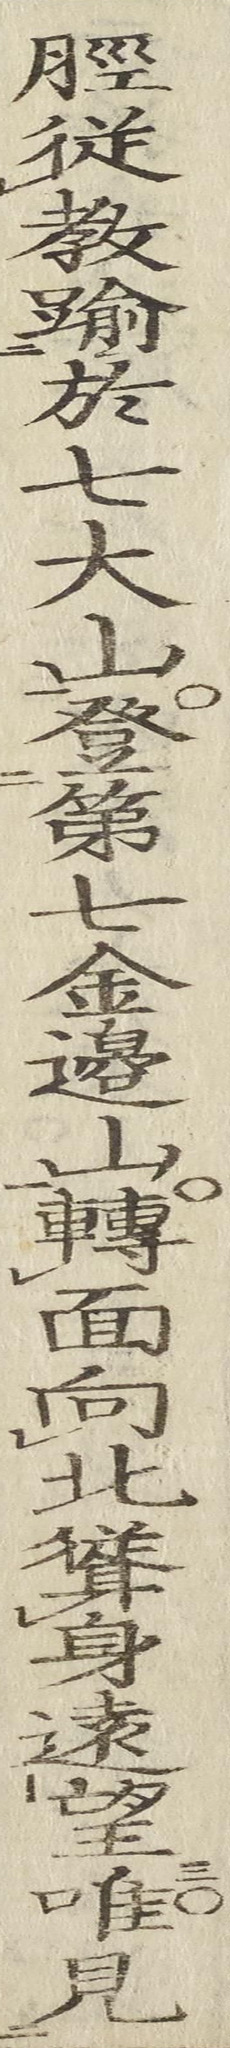脛従教踰ニ於七大山。登ニ第七金辺山。転面向北聳身遠ー望。唯見ニ
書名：護法新論　二編　上
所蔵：東京大学地震研究所図書室 Earthquake Research Institute Library, The University of Tokyo, JAPAN
